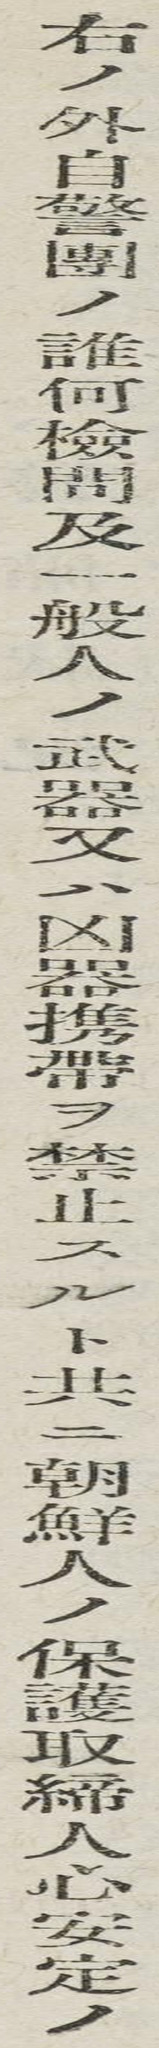右ノ外自警団ノ誰何検問及一般人ノ武器又ハ凶器携帯ヲ禁止スルト共ニ朝鮮人ノ保護取締人心安定ノ
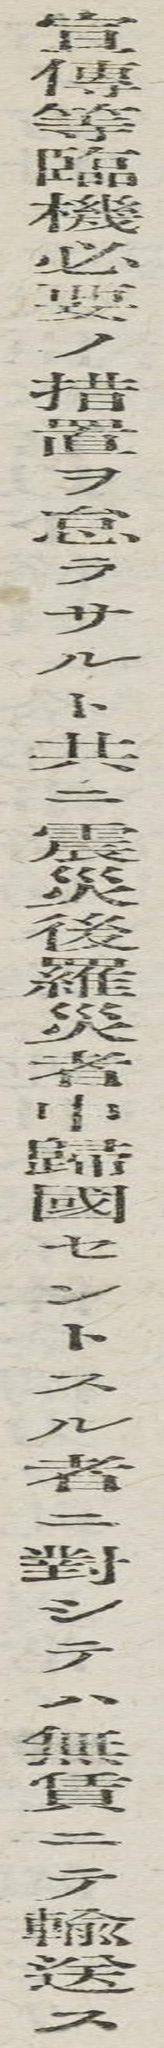宣伝等臨機必要ノ措置ヲ怠ラサルト共ニ震災後罹災者中帰国セントスル者ニ対シテハ無賃ニテ輸送ス
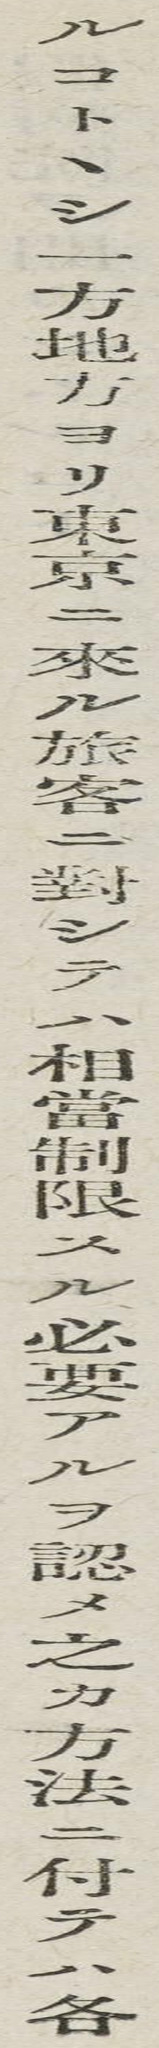ルコトヽシ一方地方ヨリ東京ニ来ル旅客ニ対シテハ相当制限スル必要アルヲ認メ之カ方法ニ付テハ各
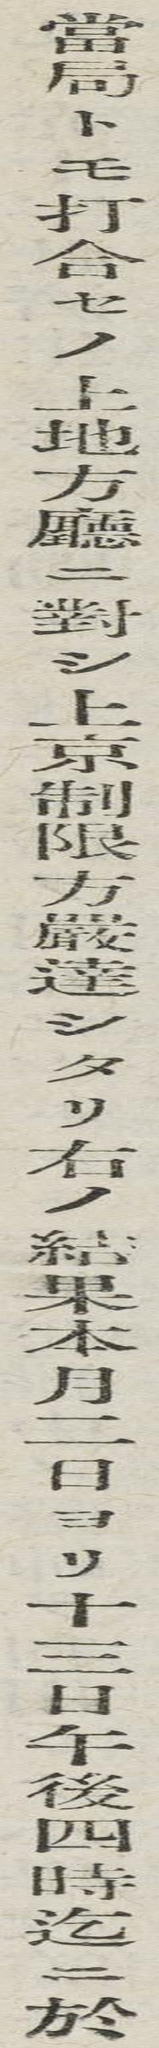当局トモ打合セノ上地方庁ニ対シ上京制限方厳達シタリ右ノ結果本月二日ヨリ十三日午後四時迄ニ於
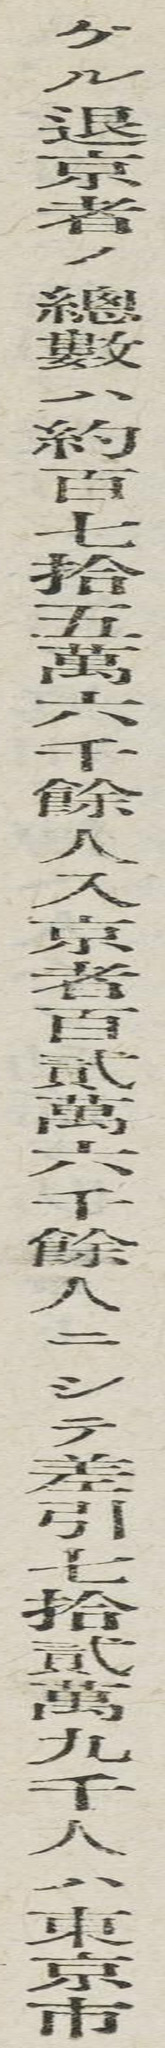ケル退京者ノ総数ハ約百七拾五万六千余人入京者百貮万六千余人ニシテ差引七拾貮万九千人ハ東京市
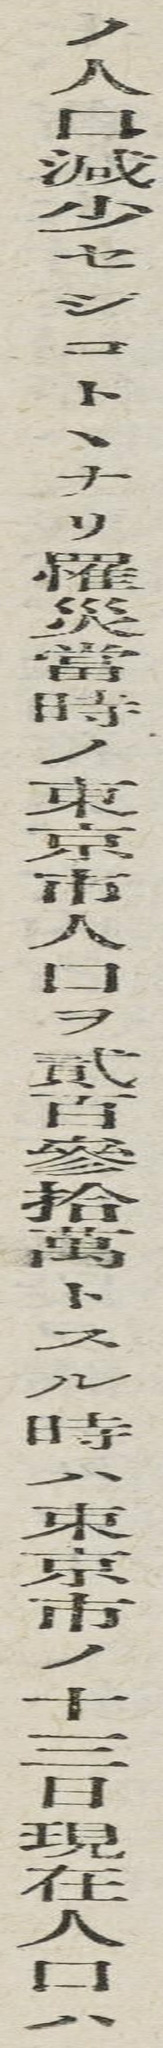ノ人口減少セシコトヽナリ罹災当時ノ東京市人口ヲ貮百参拾万トスル時ハ東京市ノ十三日現在人口ハ
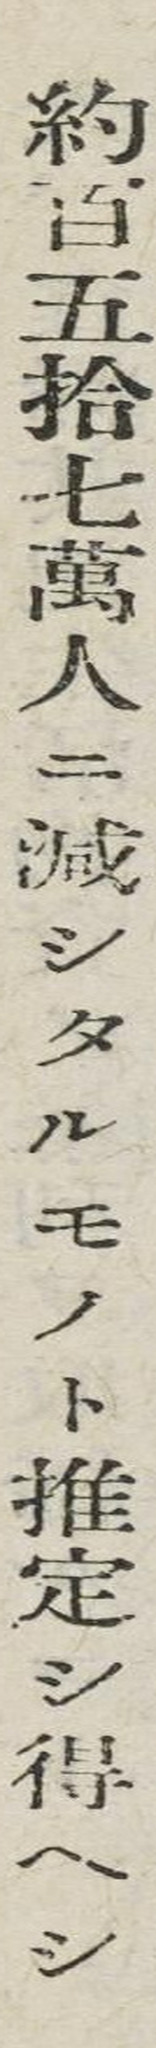約百五拾七万人ニ減シタルモノト推定シ得ヘシ
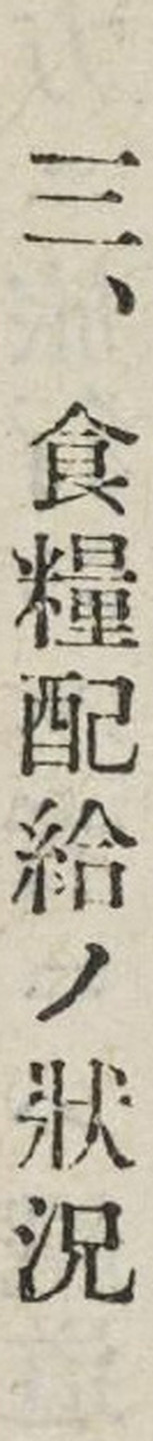三、食糧配給ノ状況
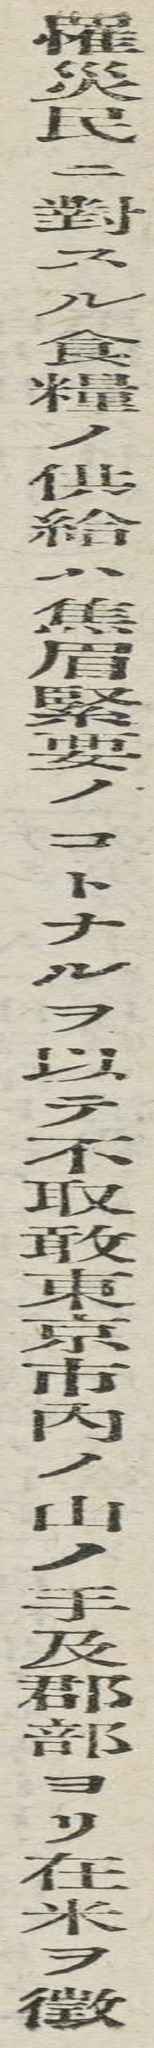罹災民ニ対スル食糧ノ供給ハ焦眉緊要ノコトナルヲ以テ不取敢東京市内ノ山ノ手及郡部ヨリ在米ヲ徴
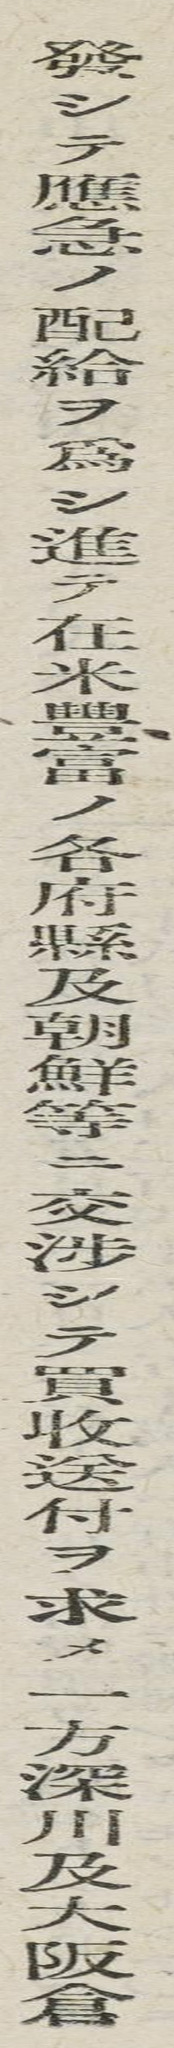発シテ応急ノ配給ヲ為シ進テ在米豊富ノ各府県及朝鮮等ニ交渉シテ買収送付ヲ求メ一方深川及大阪倉
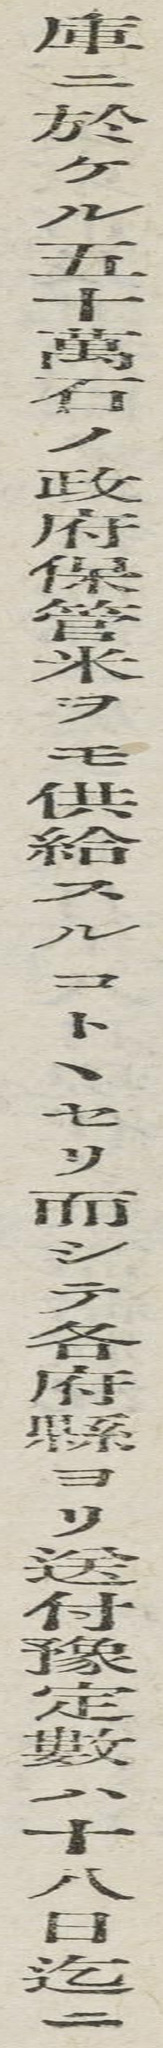庫ニ於ケル五十万石ノ政府保管米ヲモ供給スルコトヽセリ而シテ各府県ヨリ送付予定数ハ十八日迄ニ
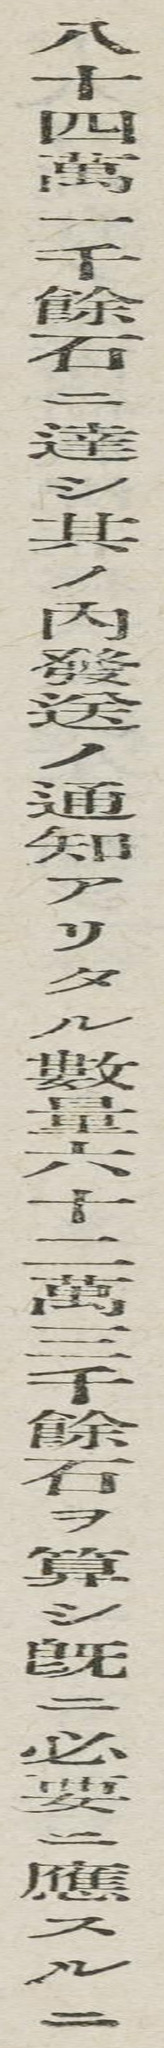八十四万一千余石ニ達シ其ノ内発送ノ通知アリタル数量六十二万三千余石ヲ算シ既ニ必要ニ応スルニ
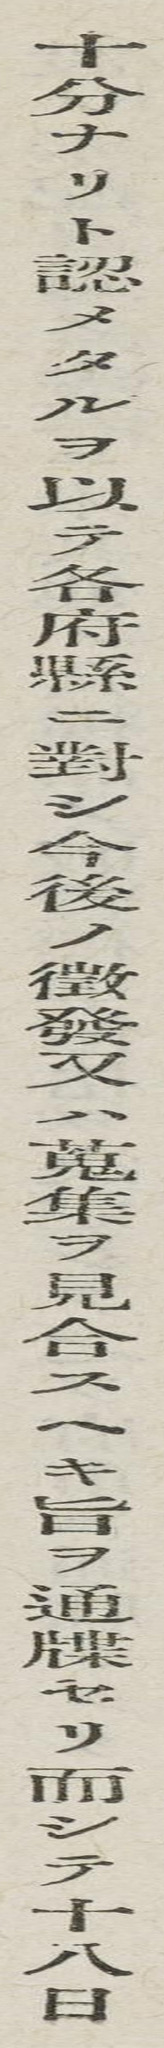十分ナリト認メタルヲ以テ各府県ニ対シ今後ノ徴発又ハ蒐集ヲ見合スヘキ旨ヲ通牒セリ而シテ十八日
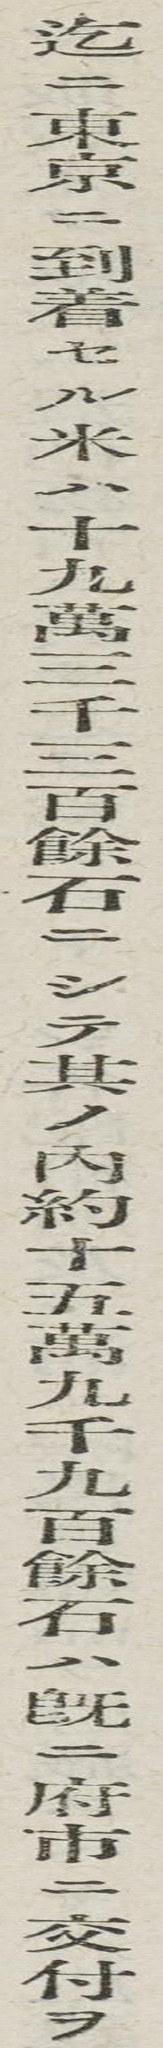迄ニ東京ニ到着セル米ハ十九万三千三百余石ニシテ其ノ内約十五万九千九百余石ハ既ニ府内ニ交付ヲ
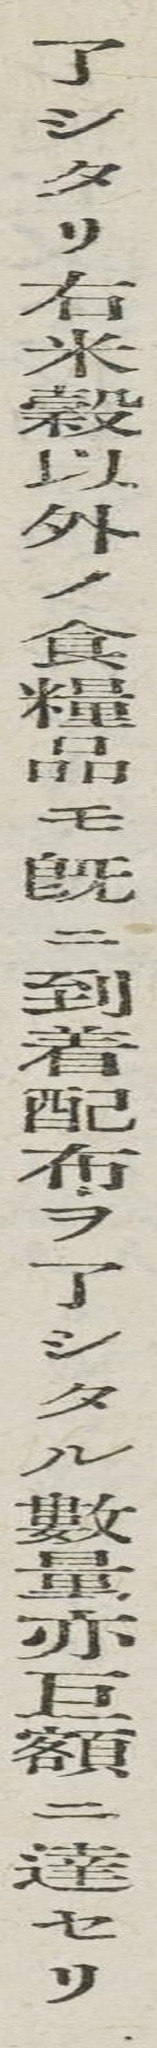了シタリ右米穀以外ノ食糧品モ既ニ到着配布ヲ了シタル数量亦巨額ニ達セリ
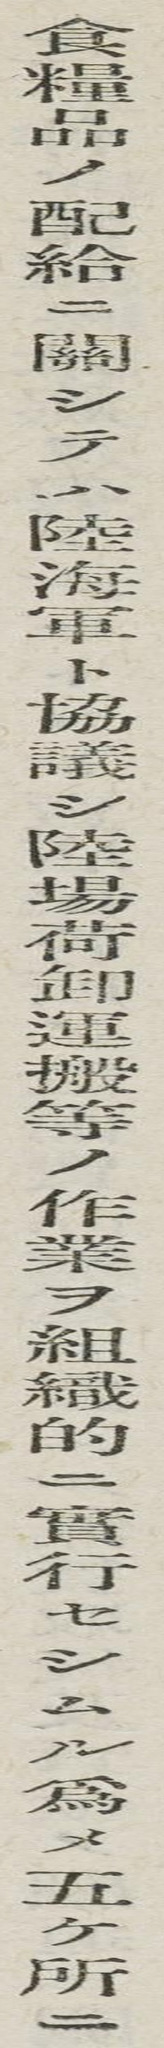食糧品ノ配給ニ関シテハ陸海軍ト協議シ陸場荷卸運搬等ノ作業ヲ組織的ニ実行セシムル為メ五ヶ所ニ
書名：震災被害状況並救護施設概要
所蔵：東京大学地震研究所図書室 Earthquake Research Institute Library, The University of Tokyo, JAPAN
